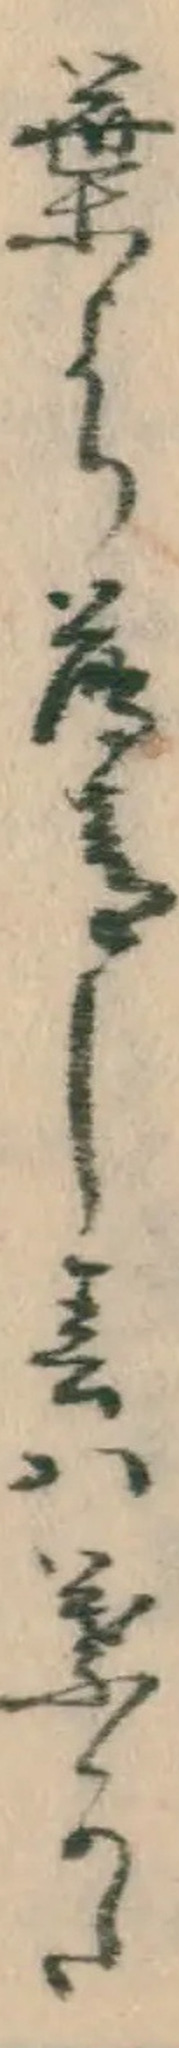葉より薄青し春は葉かた
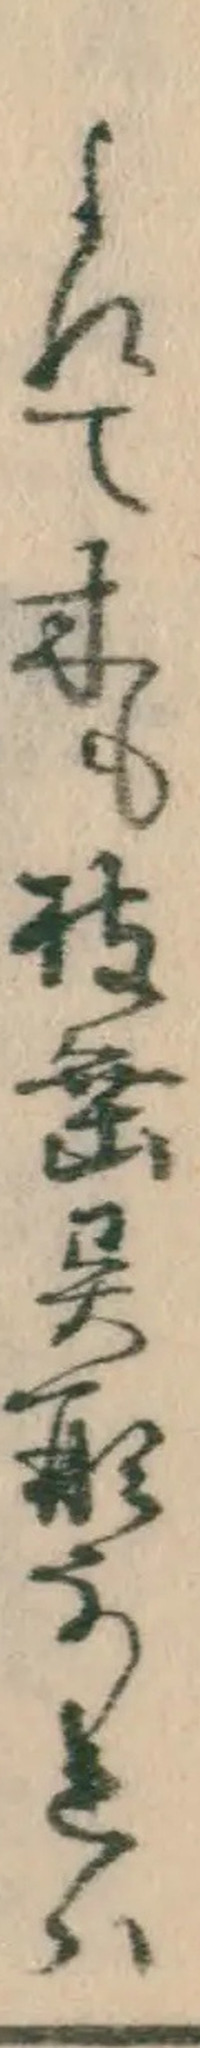よれて木も枝垂異形なれは
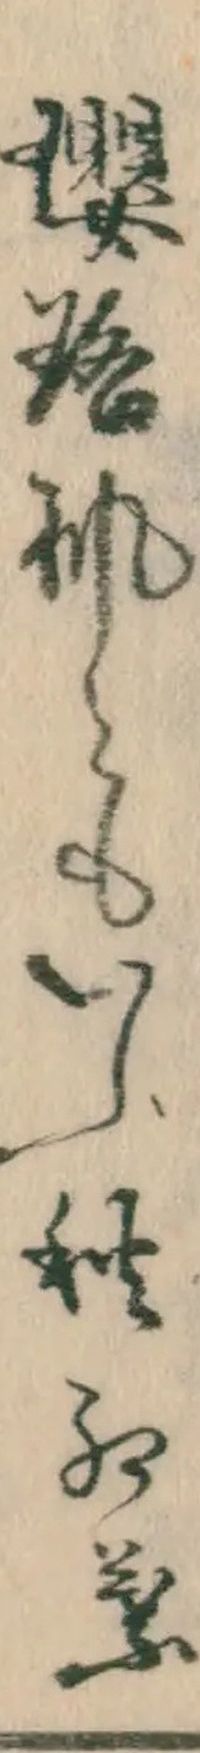瓔珞楓ともいふ秋紅葉
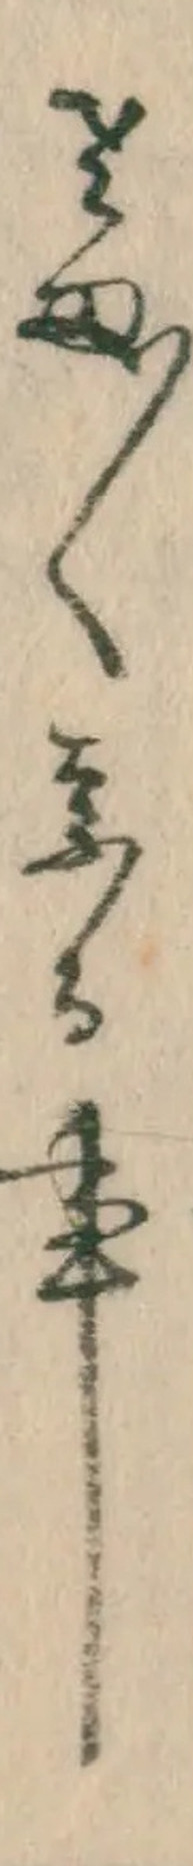さま〳〵なる事
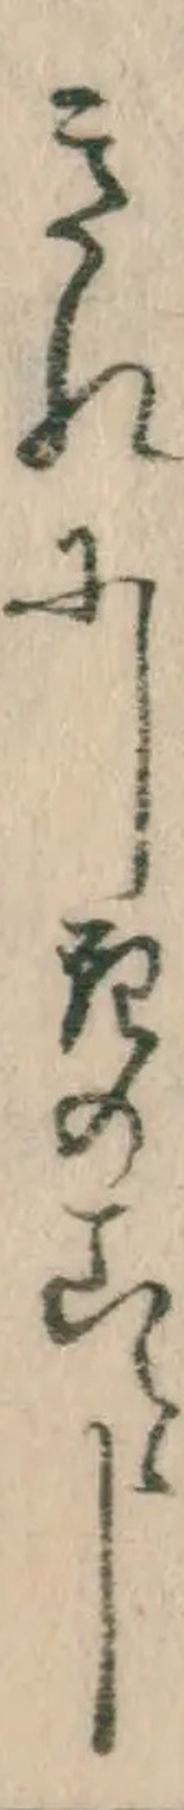きれにしきのことし
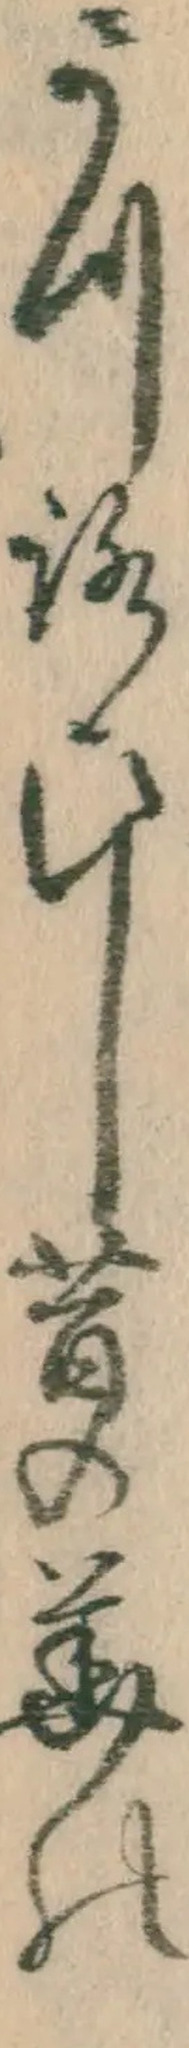うつろひし昔の花の
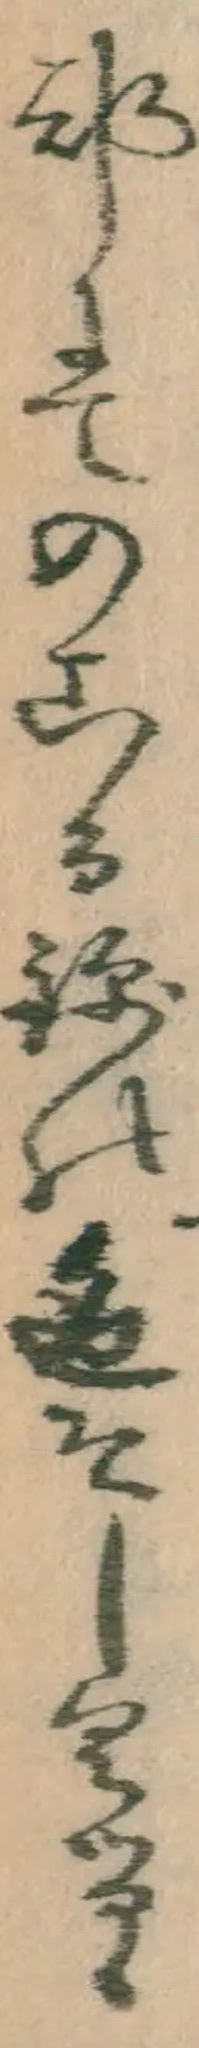都にてのこる錦の色そしくるゝ

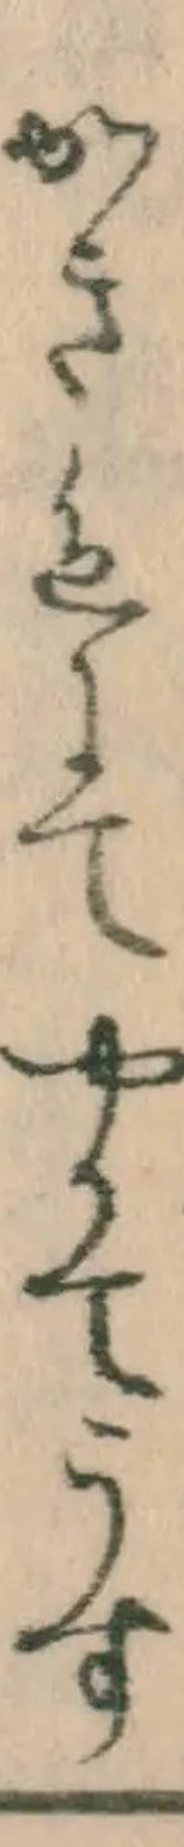かき色にてやかてうす
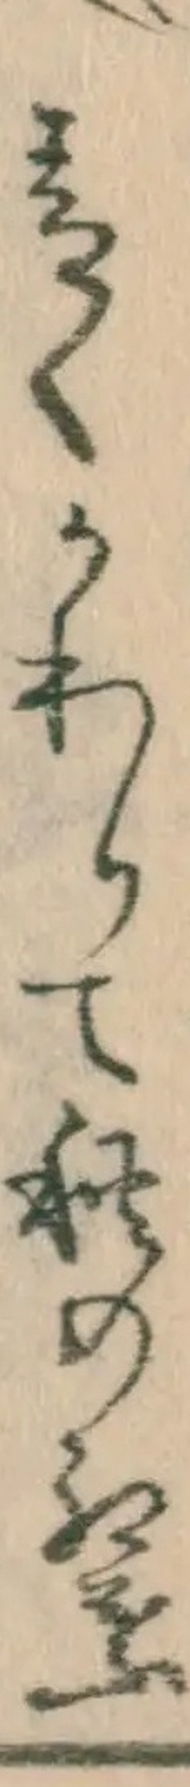青くかわりて秋の紅葉
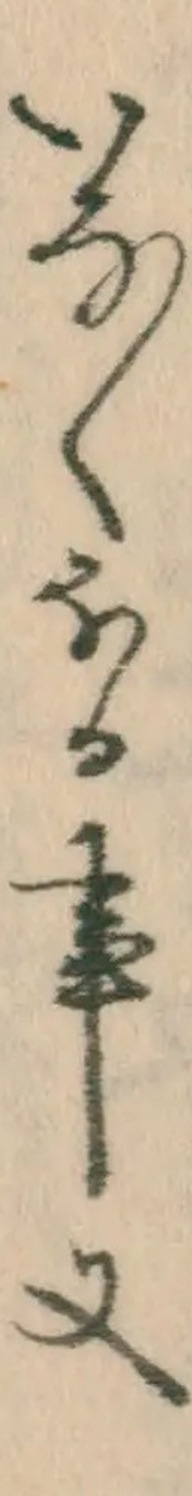いろ〳〵なる事又
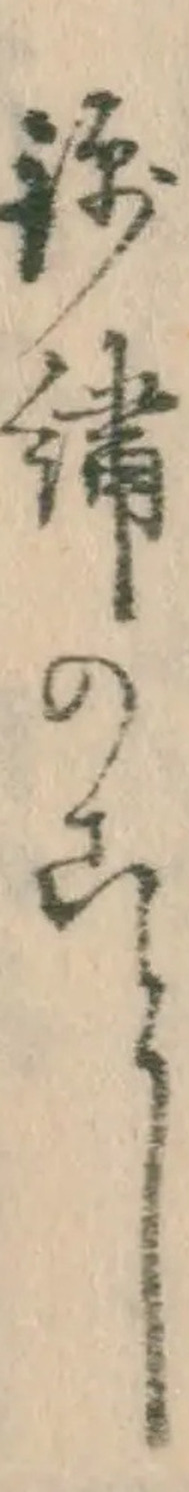錦繍のことし
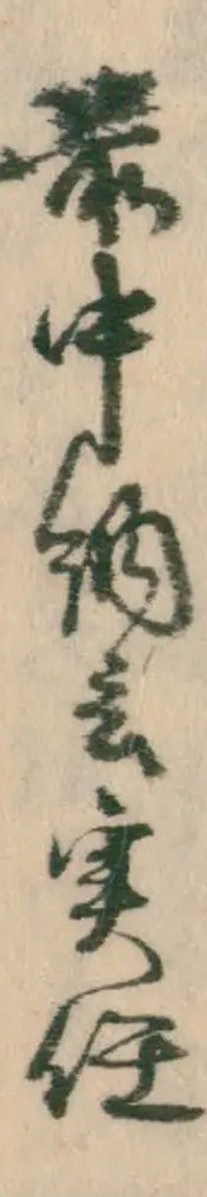前中納言実任
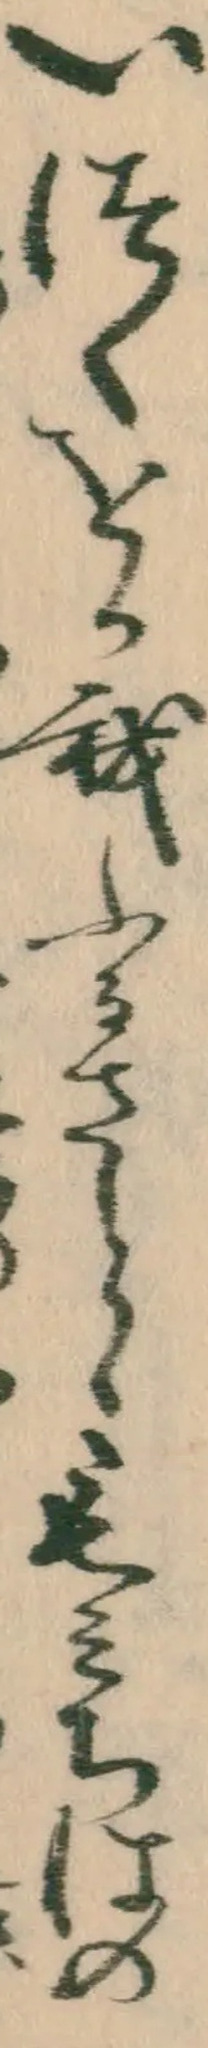いつくをか我ふるさとゝもみちはの
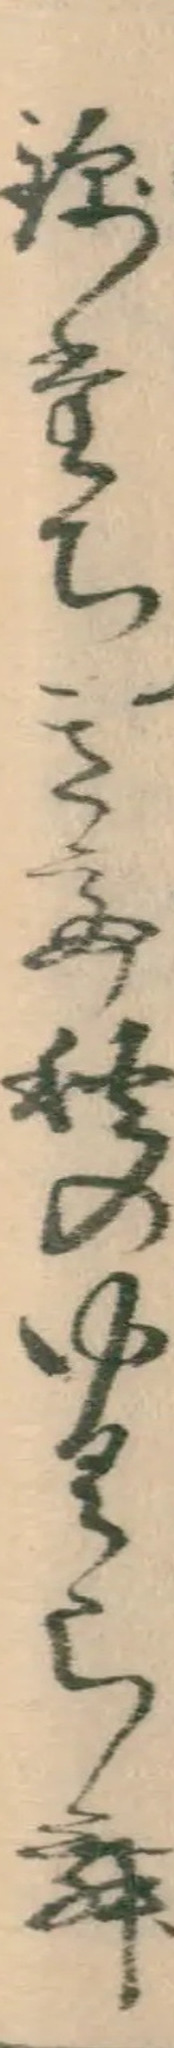錦たちきて秋のゆくらむ
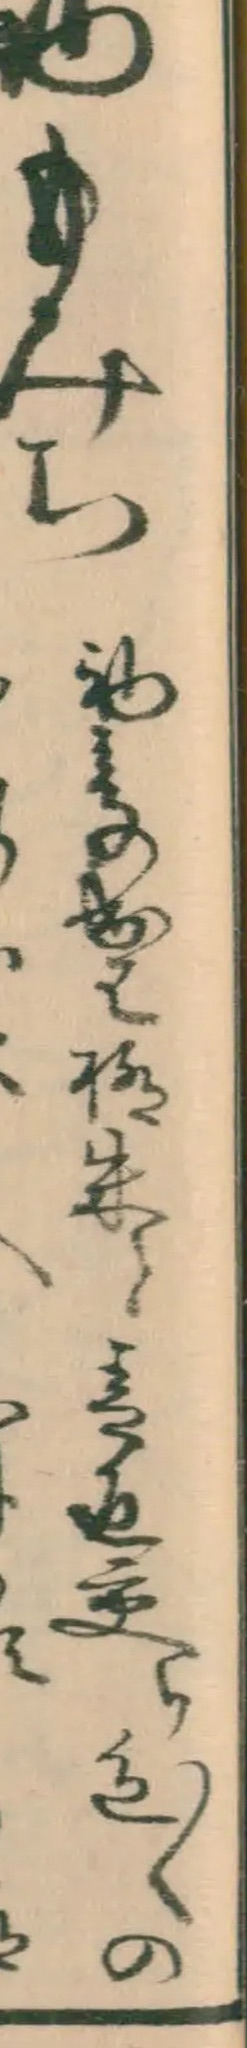初もみち初春の出は極朱と青色交り色〳〵の
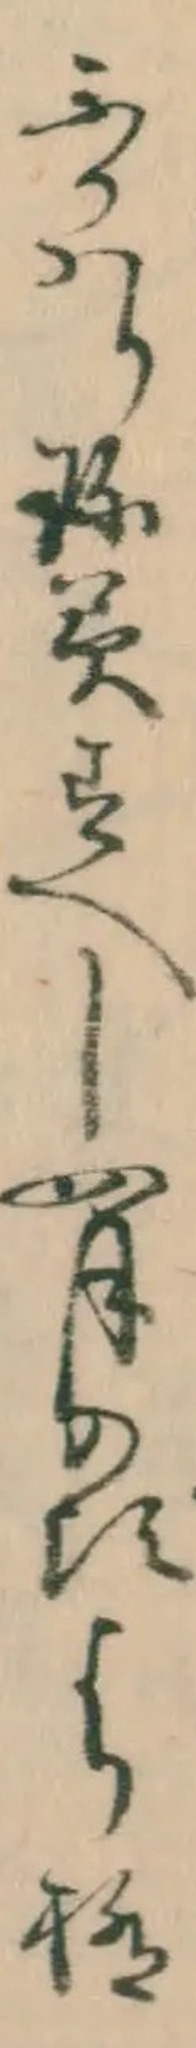ふかはり珍美すへし四月の頃より極
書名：紅葉集
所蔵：国立国会図書館 National Diet Library, JAPAN
